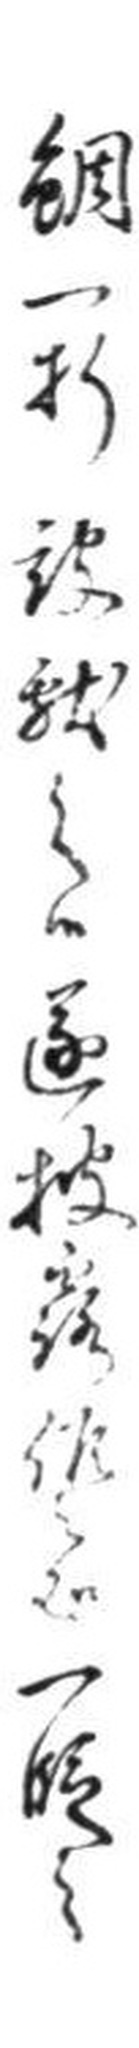鯛一折被献之候遂披露候之処一段之
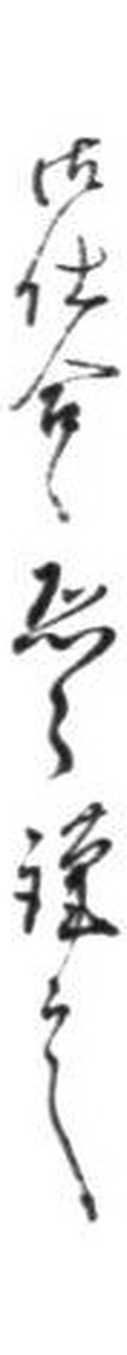御仕合候恐々謹言
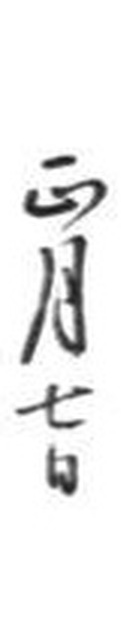正月七日
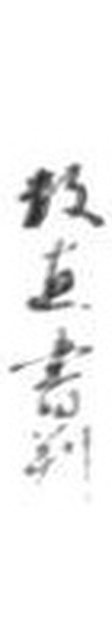数直書判
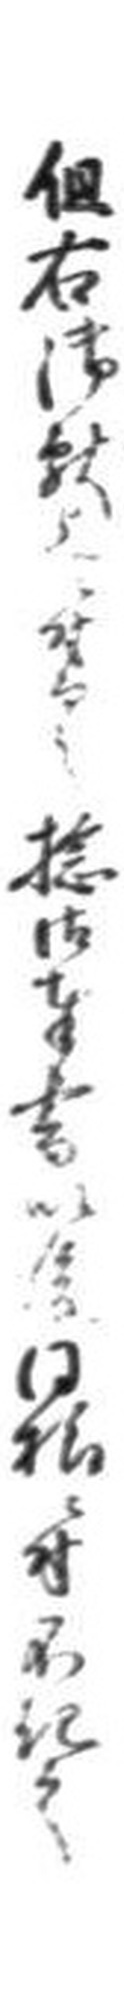但右御献上ニ付而之捻御奉書以後同様ニ付不記之
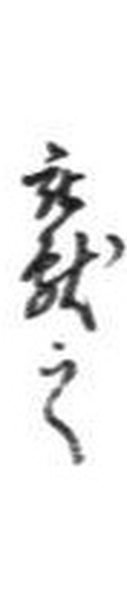被献之
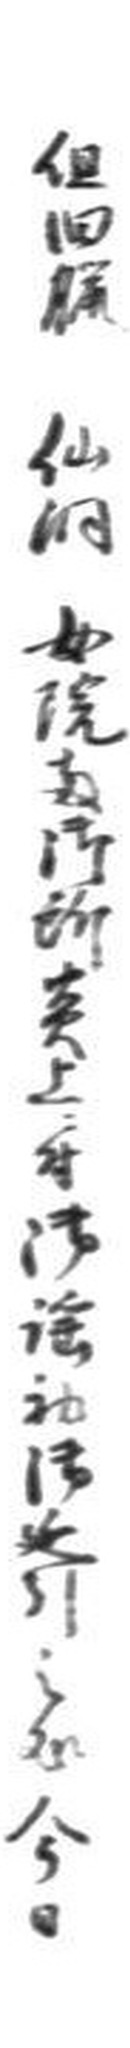但旧臘仙洞女院両御所炎上ニ付御謡初御延引之処今日
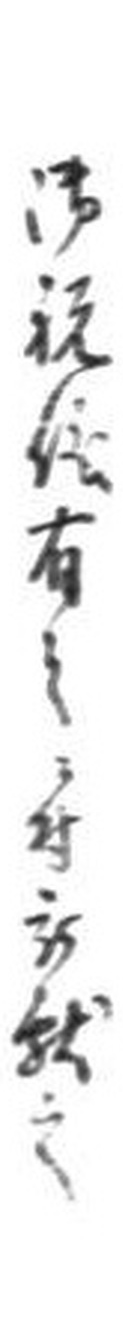御祝儀有之ニ付被献之
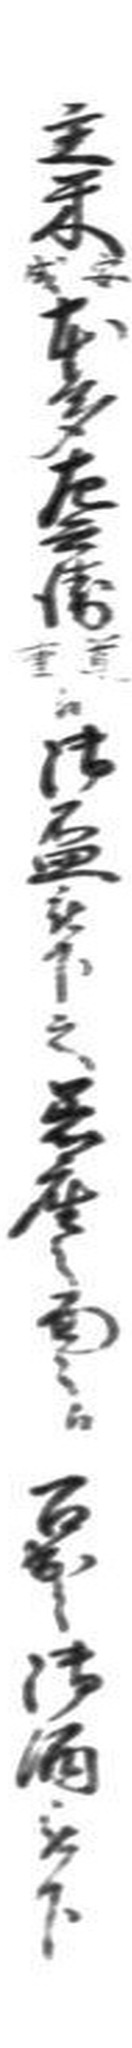主米安成本多左兵衛道重江御盃被下之着座之面々江召出之御酒被下
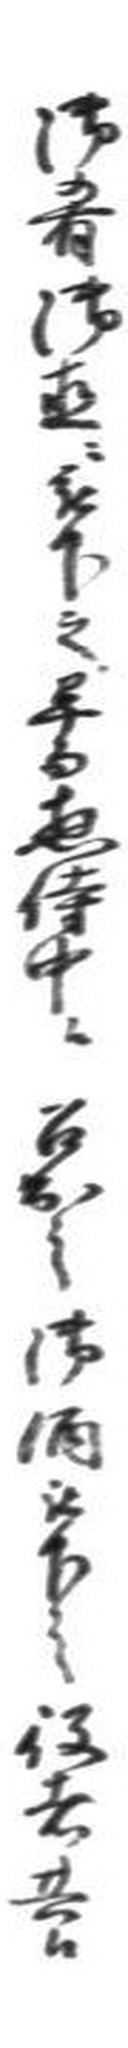御肴御直ニ被下之畢而惣侍中江召出之御酒被下之役者共江

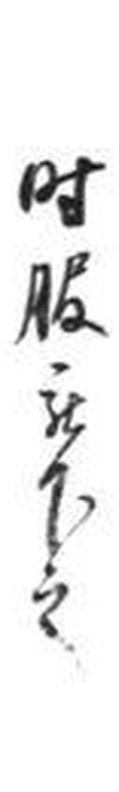時服被下之
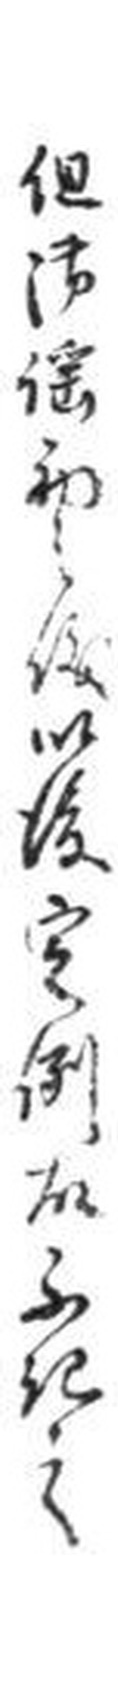但御謡初之儀以後定例故不記之
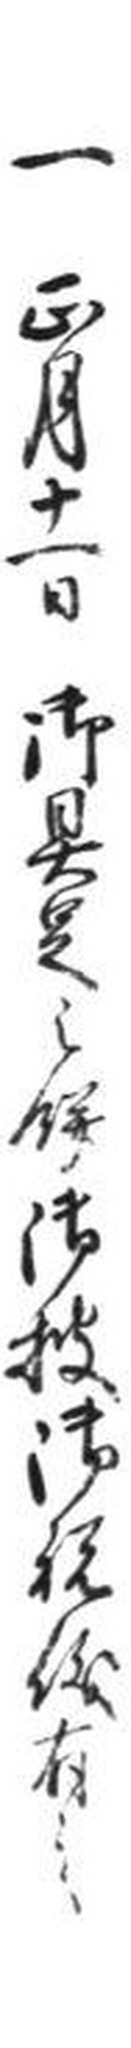一正月十一日御具足之餅御披祝儀有之
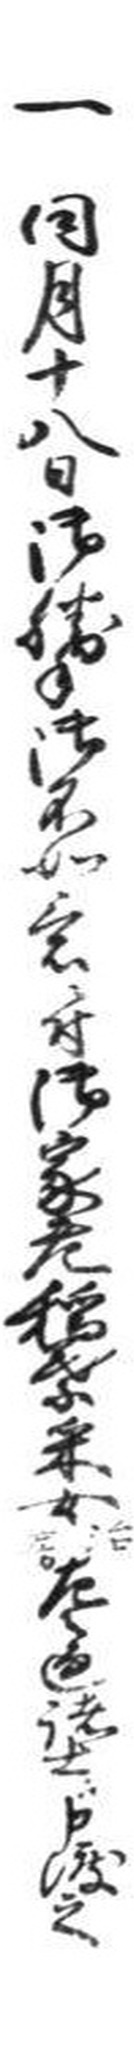一同月十八日御勝手御不如意ニ付御家老稲葉采女治房左之通諸士江申渡之
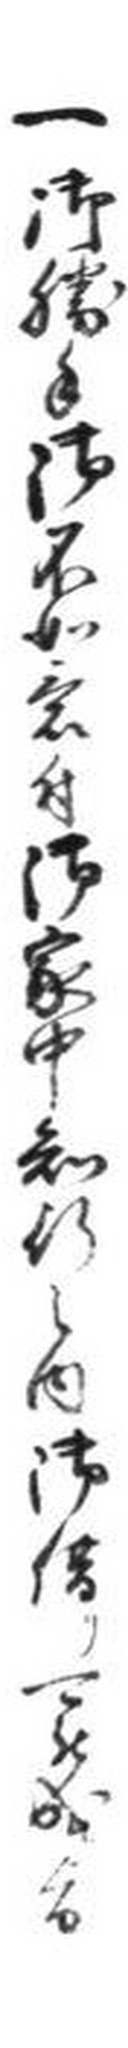一御勝手御不如意付御家中知行之内御借リ可被成旨
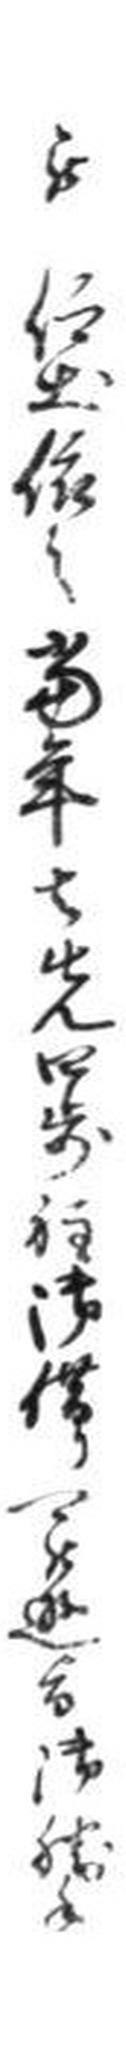被仰出依之当年者先四歩程御借リ可被遊旨御勝手
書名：家譜 十三 綱昌公 従寛文元年到延宝五年
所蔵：福井県文書館 Fukui Prefectural Archives
